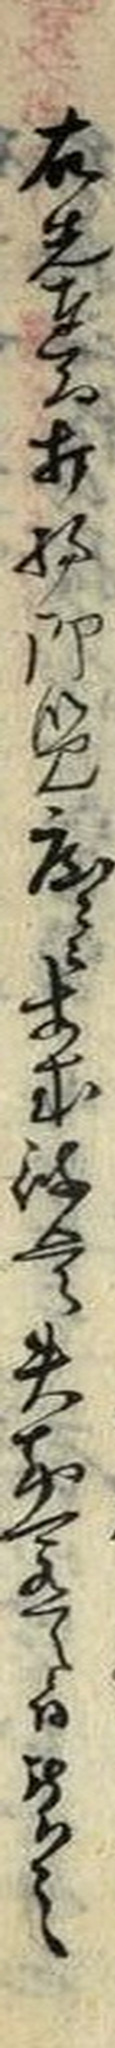右先達而打揚御覧度々ニ相成彼是失却可有之ニ付被下之
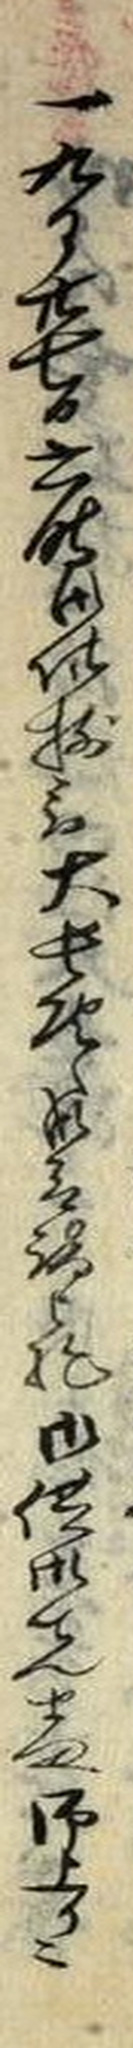一九月廿七日六時御供揃ニ而大長院へ御参詣被遊御供御先番御上りニ

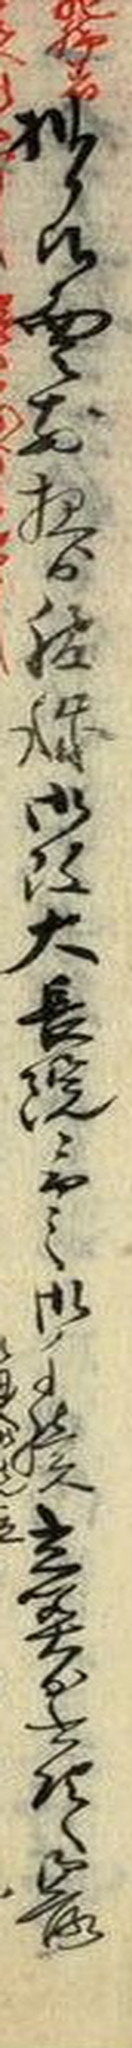掛り候面々前夜ゟ服穢御改大長院ニ而之御手続玄関ゟ書院へ御落
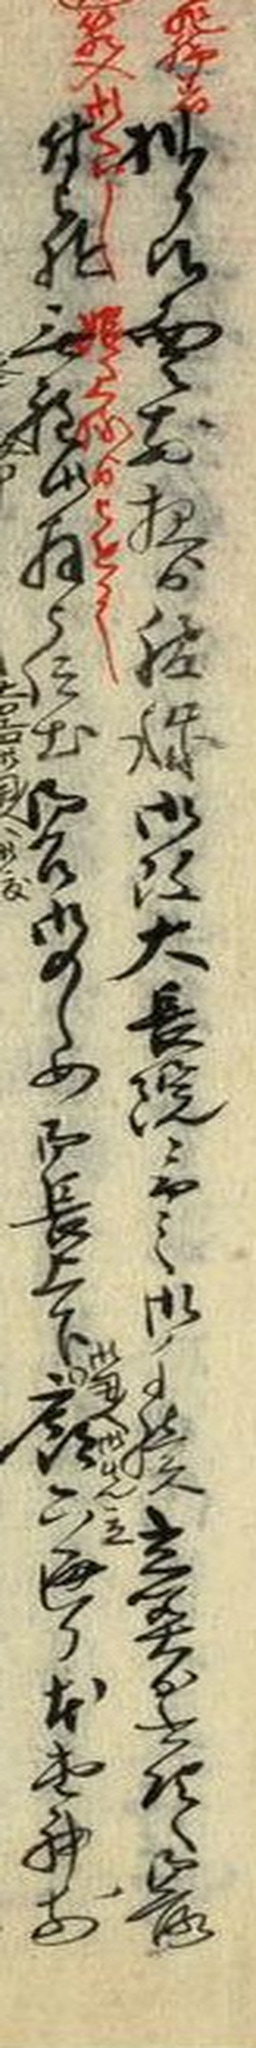付被遊無程御拝被仰出御召御のしめ御長上下〇御用人御先立廊下通り本堂神前
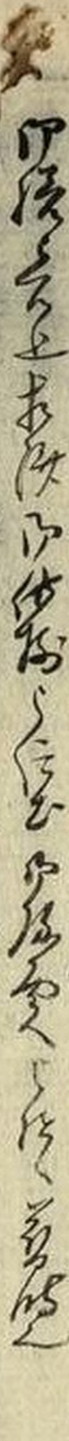御膳被召上相済御供揃被仰出御帰殿被遊候暮時也
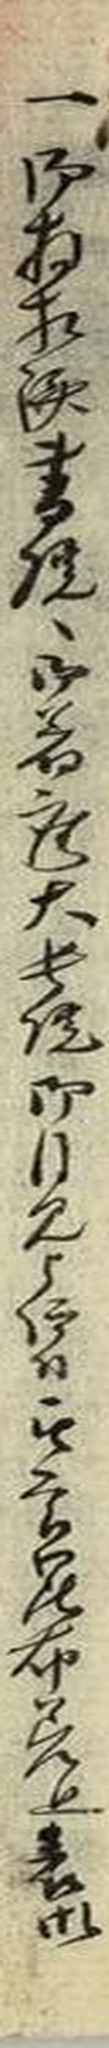一御拝相済書院へ御着座大長院御目見被仰付其節昆布差上表御
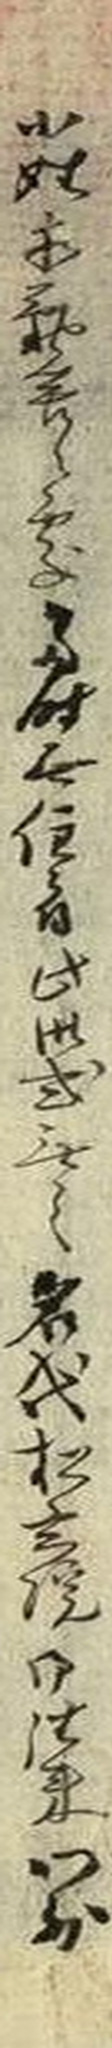小姓相勤筈之処当時無住ニ付此御式無之名代松玄院御往来以外
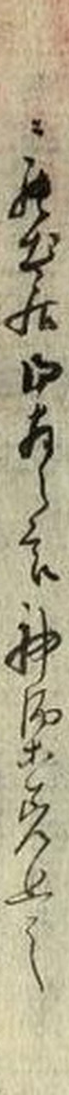ニ罷出居御拝之節神酒等差上之
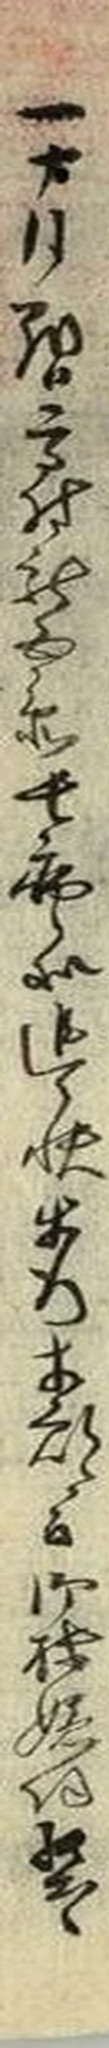一十月朔日高村新五兵衛長病之処追々快歩行相願候ニ付御機嫌伺罷出候
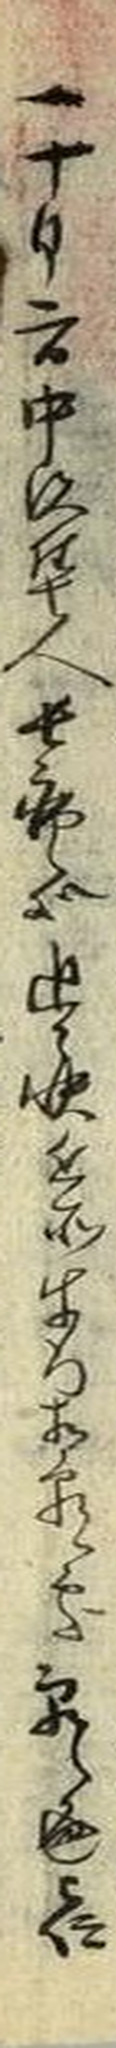一十月二日中沢隼人長病之処追々快近所歩行相願候処願之通被仰
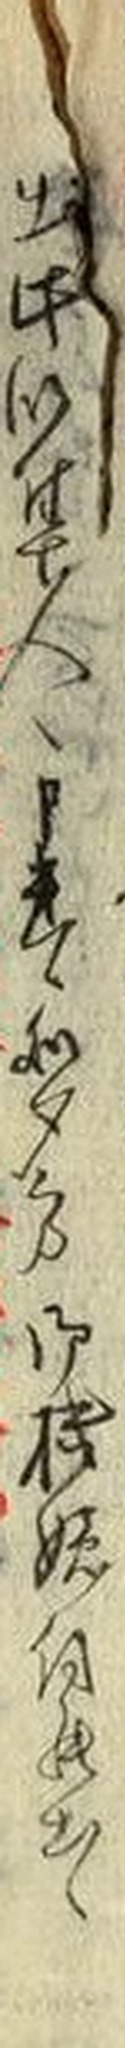出此段隼人へ申遣候処夕方御機嫌伺罷出候
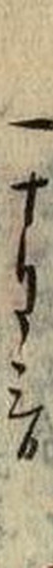一十月三日
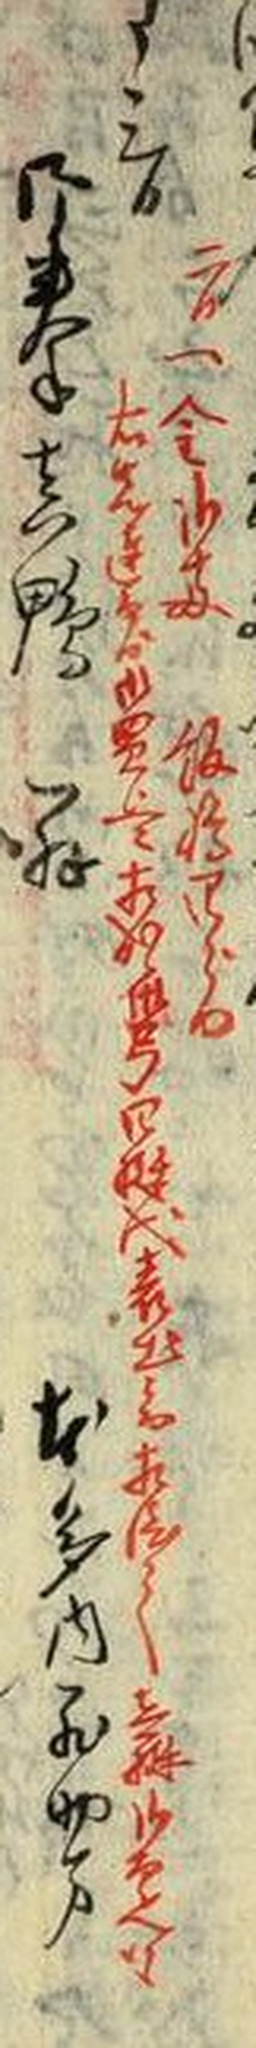御拳真鴨一羽本多内蔵助方
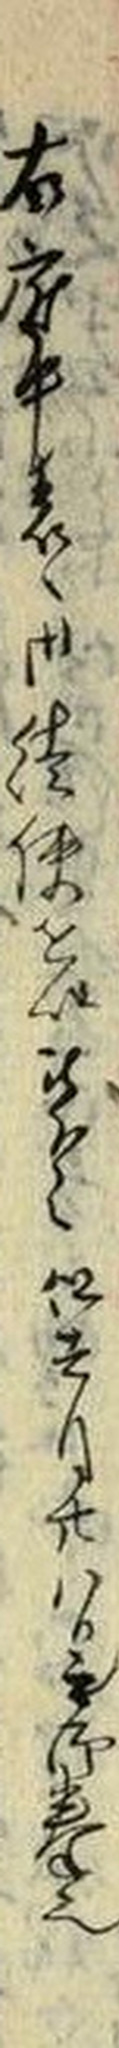右府中表へ御徒使を以被下之但去月廿八日之御拳也
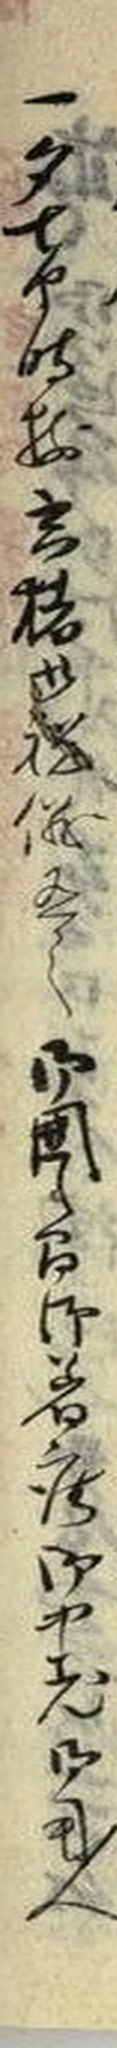一夕七半時揃玄猪御祝儀有之御囲之間御着座御中老御用人
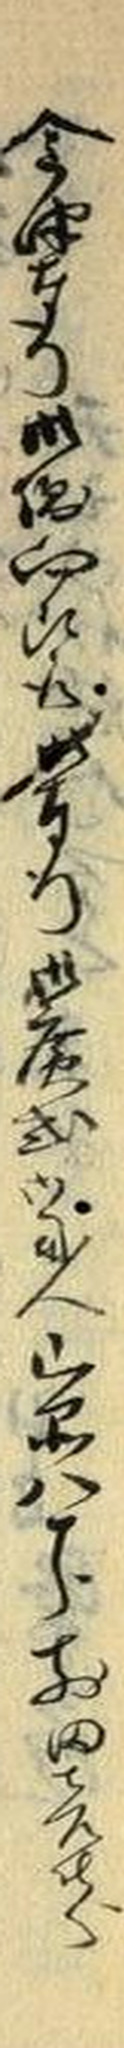金津奉行御側向頭取御奉行御広式御用人山品八十郎前田彦次郎
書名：少傅日録抄（斉承付側向頭取日記、在国）
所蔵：福井県文書館 Fukui Prefectural Archives
